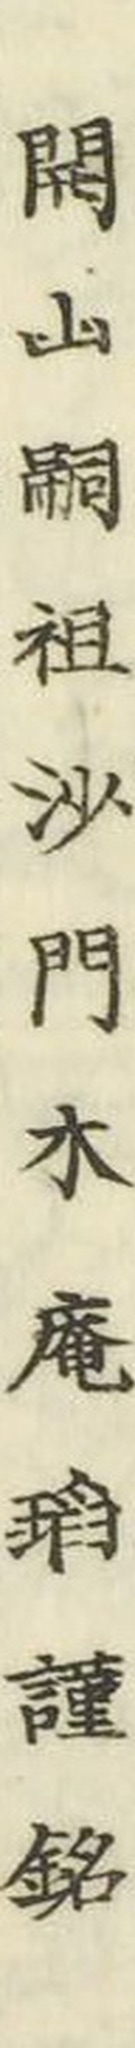開山嗣祖沙門木庵瑫謹銘
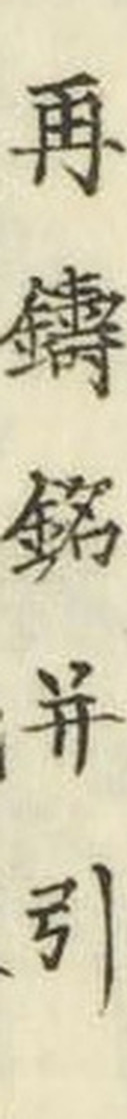再鑄銘并引
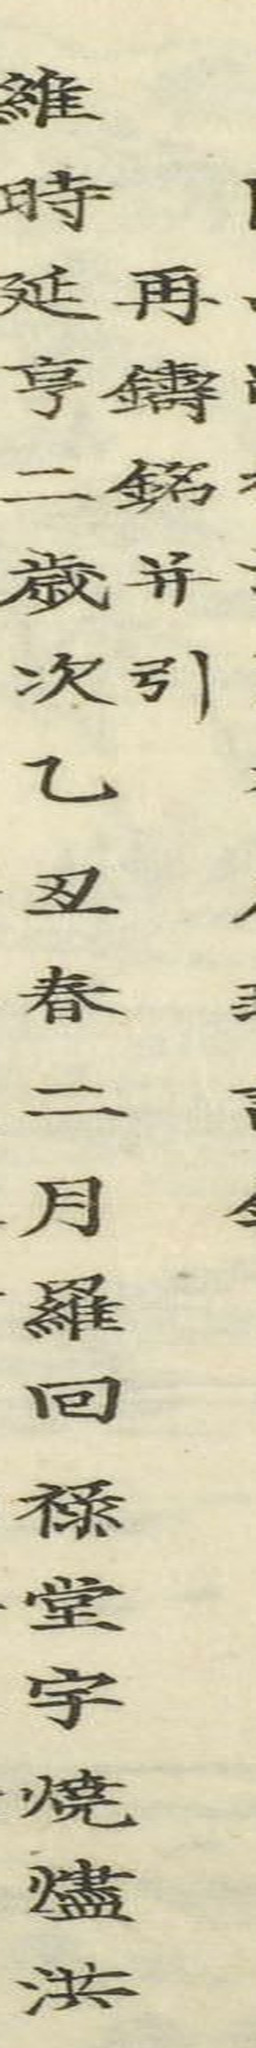維時延亨二歳次乙丑春二月羅回禄堂宇燒燼洪
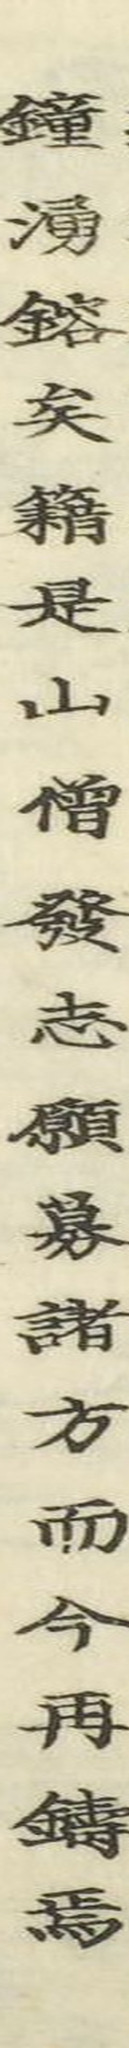鐘湧鎔矣籍是山僧發志願募諸方而今再鑄焉
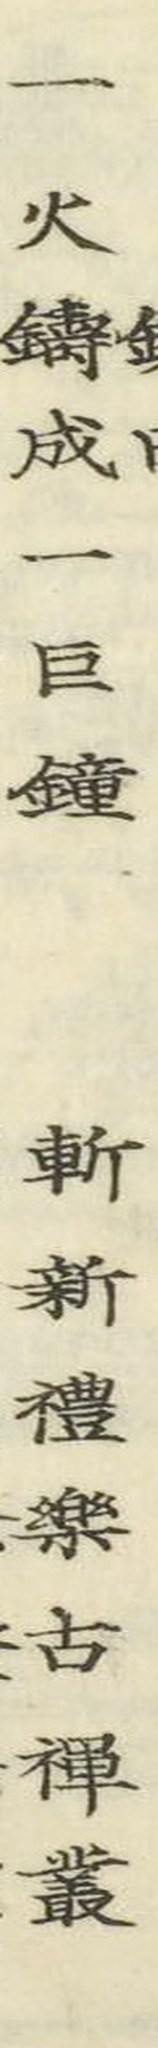一火鑄成一巨鐘斬新禮樂古禪叢
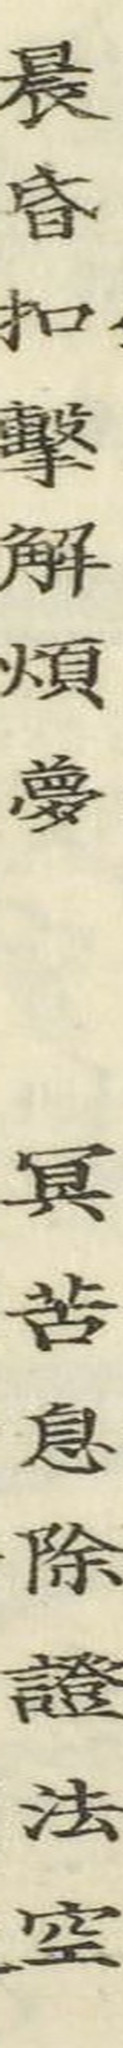晨昏扣擊解煩夢冥苦息除證法空
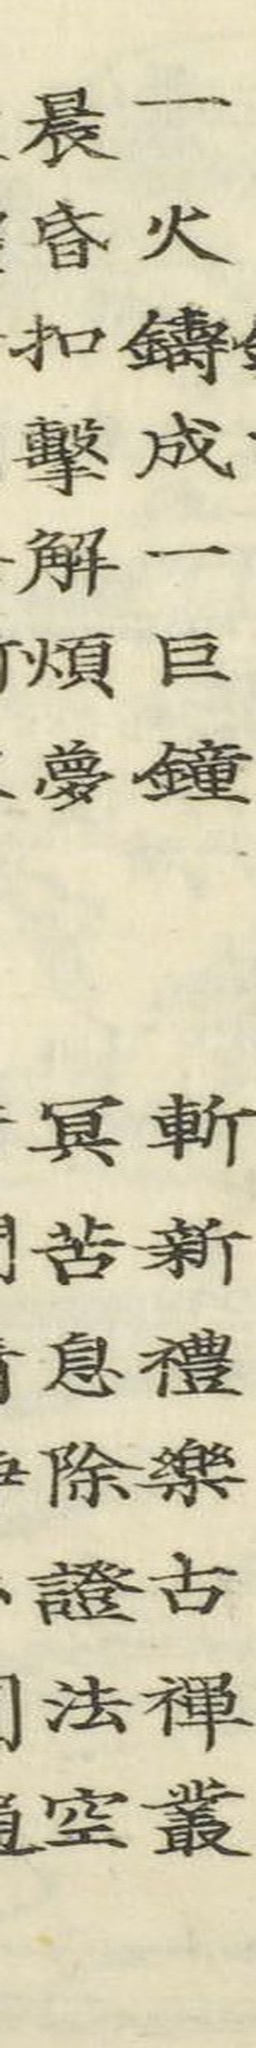晨昏扣擊解煩夢冥苦息除證法空
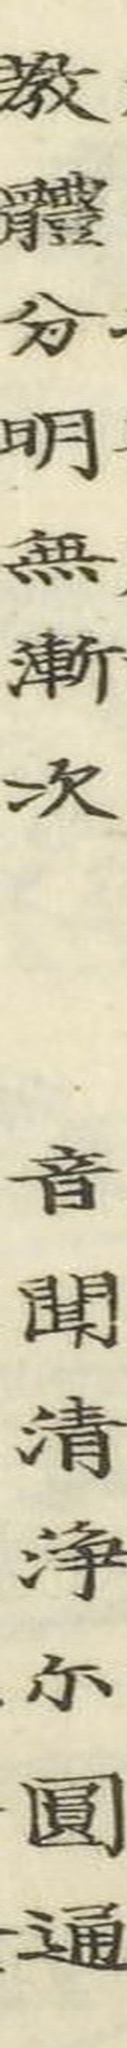教體分明無漸次音聞清浄尓圓通
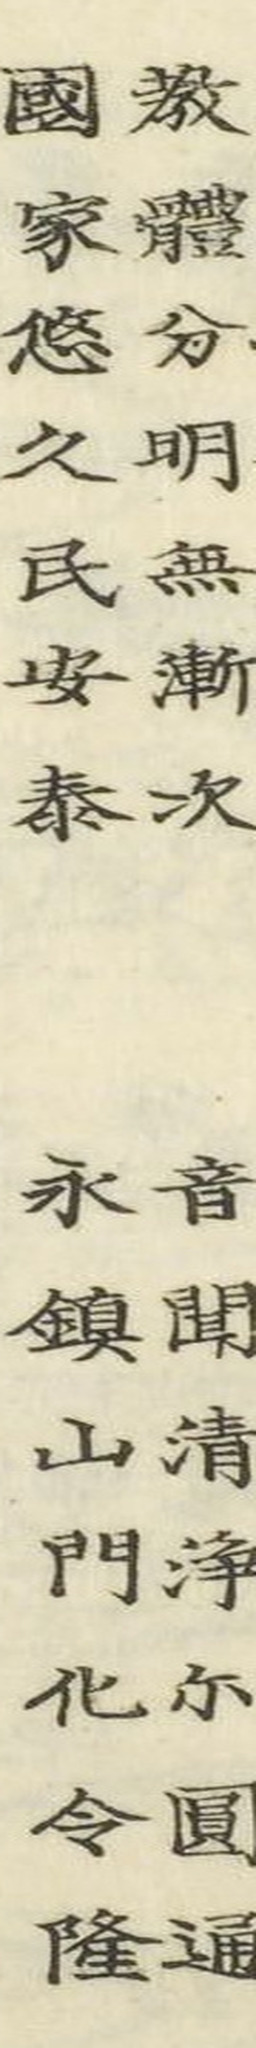國家悠久民安泰永鎮山門化令隆
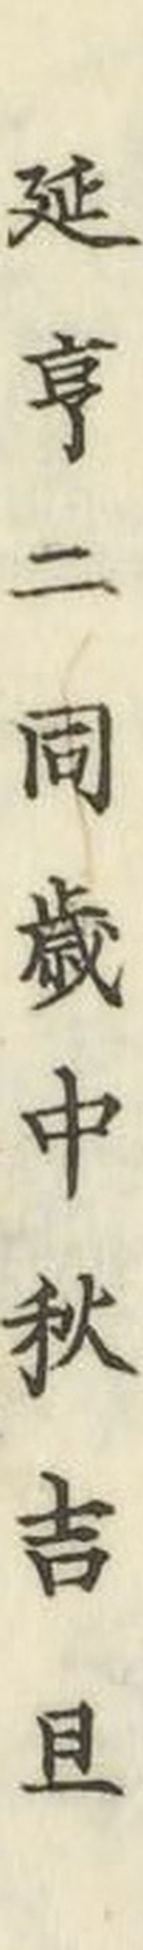延亨二同歳中秋吉旦
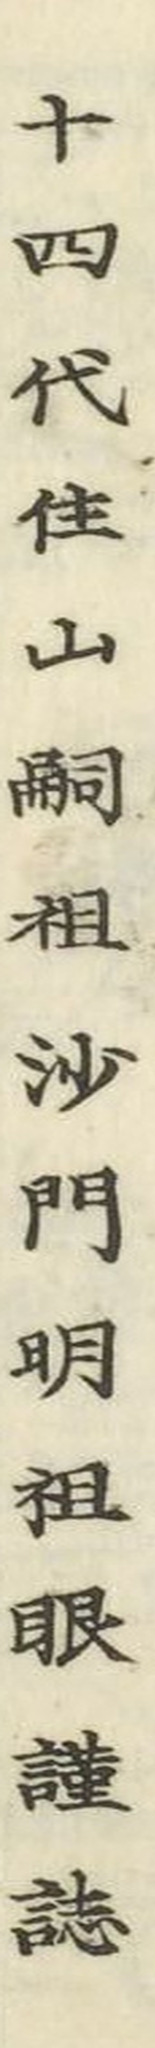十四代住山嗣祖沙門明祖眼謹誌
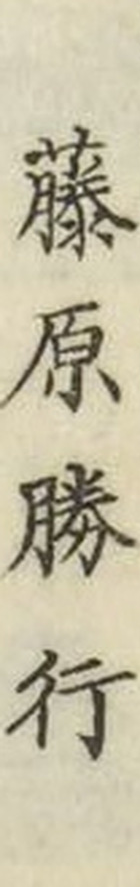藤原勝行
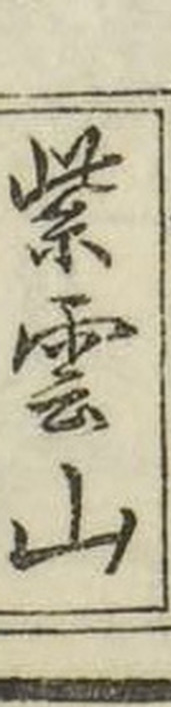紫雲山
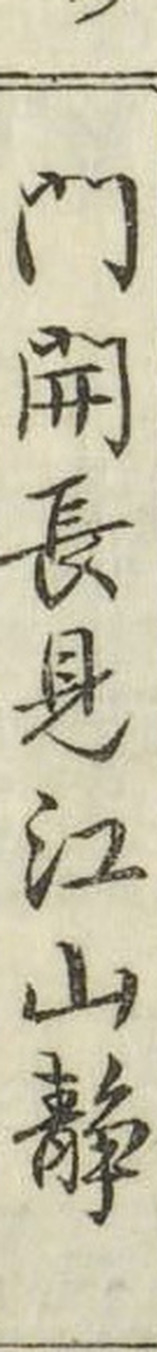門開長見江山静
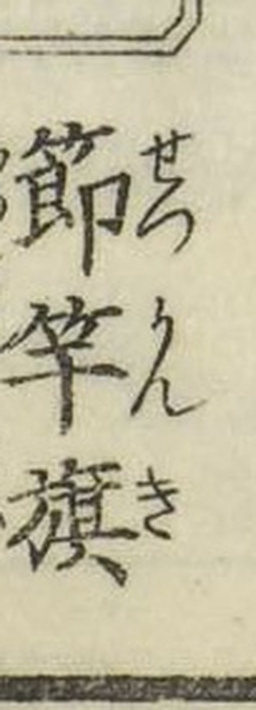節竿旗
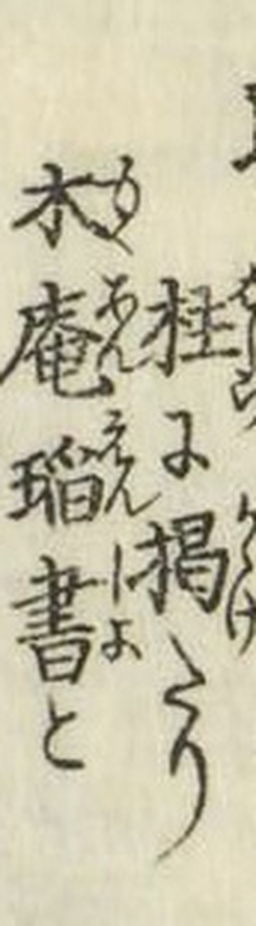木庵瑫書と
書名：江戸名所図会 20巻 巻之7
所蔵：東京学芸大学教育コンテンツアーカイブ
